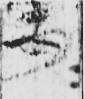十月
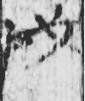戊
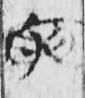寅
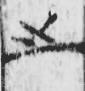之
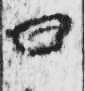日
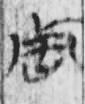周
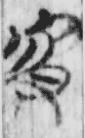賜
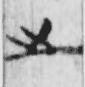之
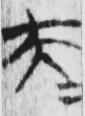大夫
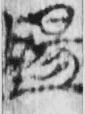○（陽）
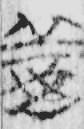義
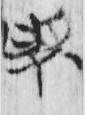受
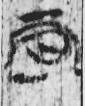○（期）
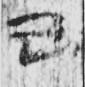己
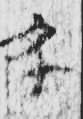丑
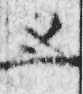之
